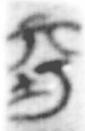坪（平）
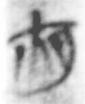夜
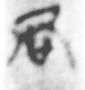君
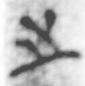之
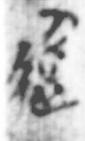○（路）
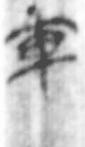車
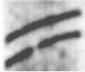二
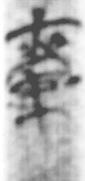𨍱（乘）
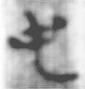屯
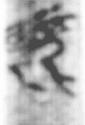麗
